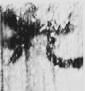九
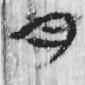月
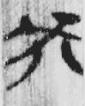癸
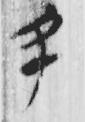丑
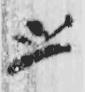之
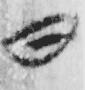日
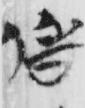俈
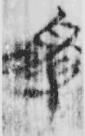暖
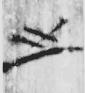之
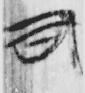司
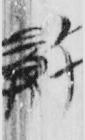敗
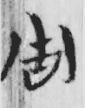周
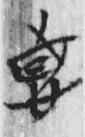惑
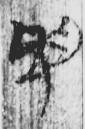受
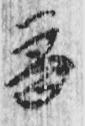○（期）
